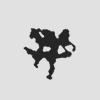兵
